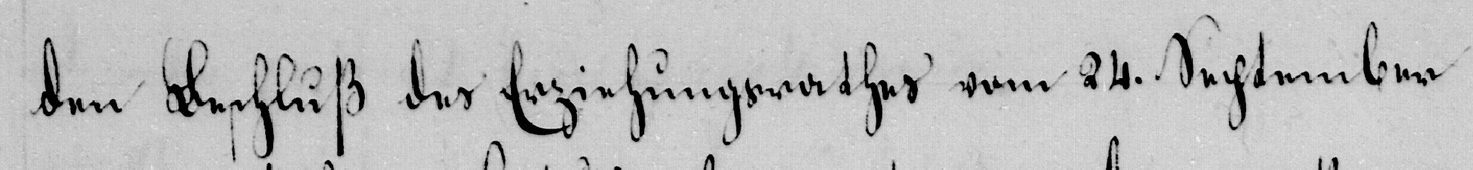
den Beschluß des Erziehungsrathes vom 24. September
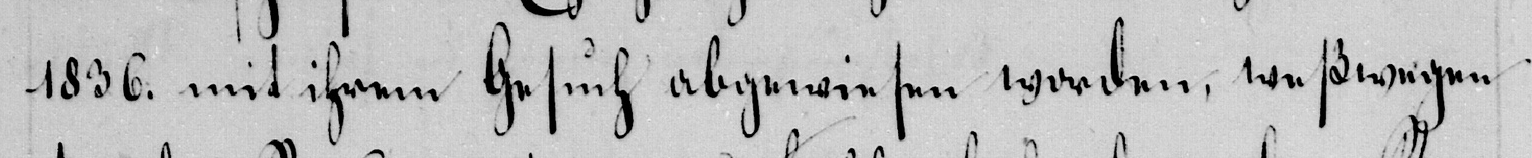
1836. mit ihrem Gesuch abgewiesen worden, weßwegen
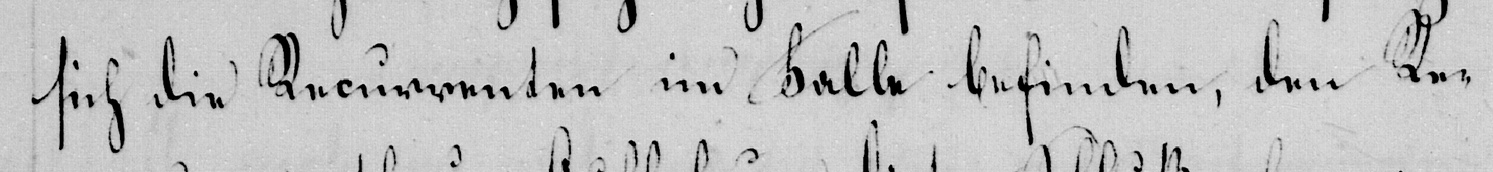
sich die Recurrenten im Falle befinden, den Re¬
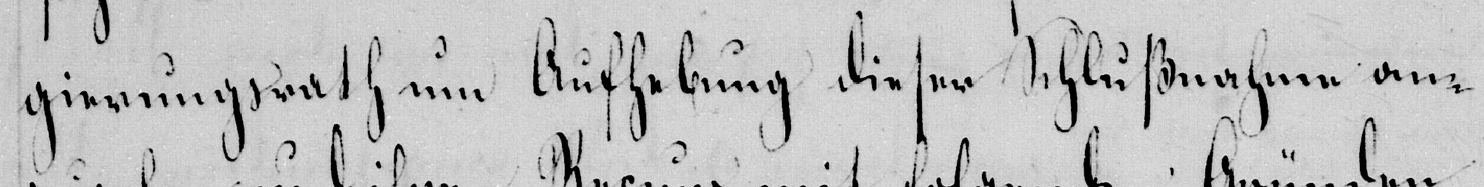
gierungsrath um Aufhebung dieser Schlußnahme an¬
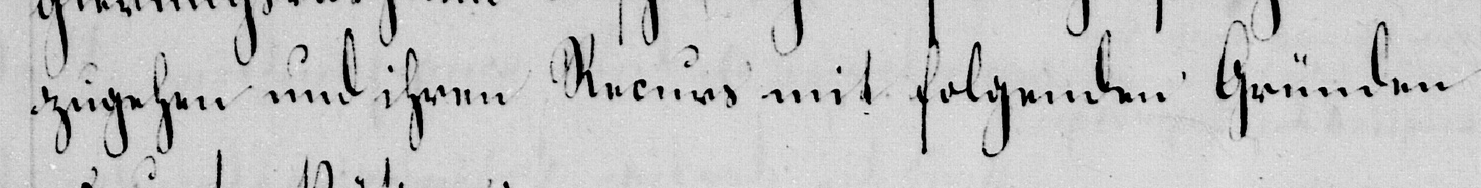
zugehen und ihren Recurs mit folgenden Gründen
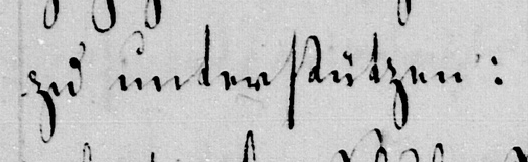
zu unterstützen:
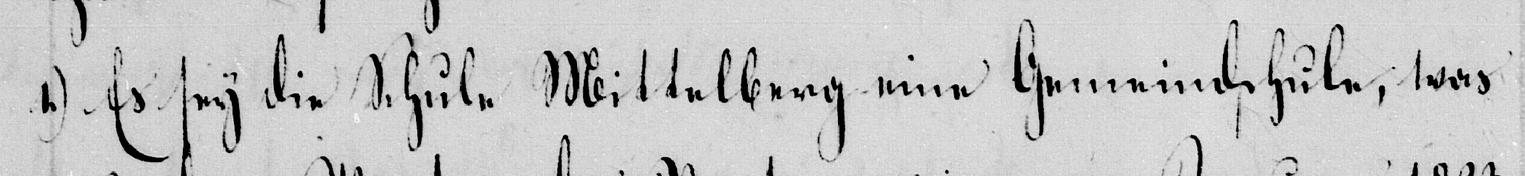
1.) Es sey die Schule Mittelberg eine Gemeindschule, was
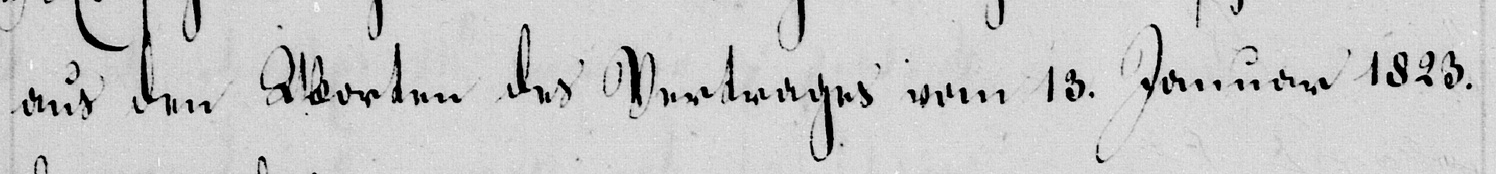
aus den Worten des Vertrages vom 13. Januar 1823.
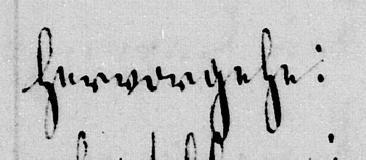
hervorgehe:
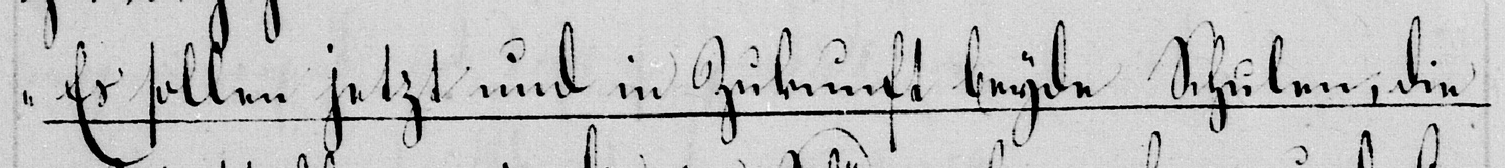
„Es sollen jetzt und in Zukunft beyde Schulen, die
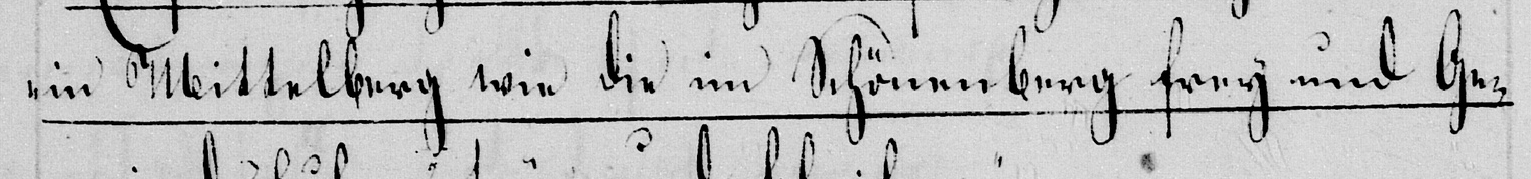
im Mittelberg wie die im Schönenberg frey und Ge¬
